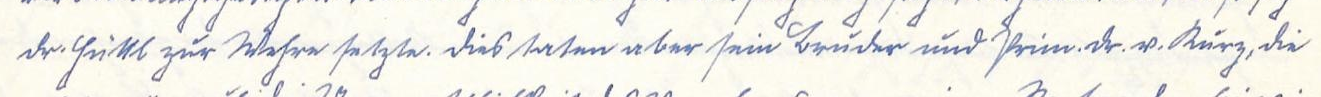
Dr. Hüttl zur Wehre setzte. Dies taten aber sein Bruder und Prim Dr. v. Kurz, die
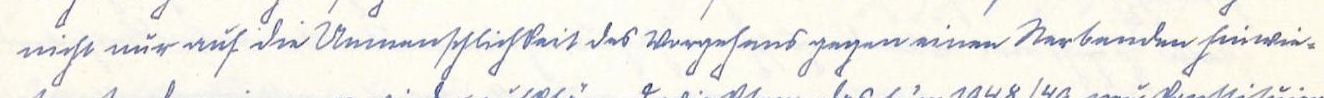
nicht nur auf die Unmenschlichkeit des Vorgehens gegen einen Sterbenden hinwie-
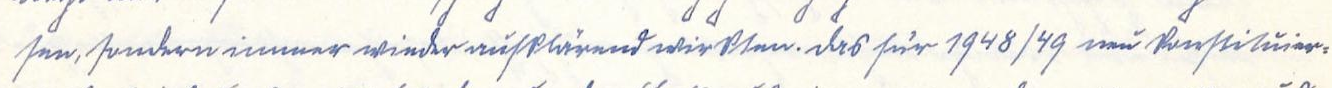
sen, sondern immer winder aufklärend wirkten. Das für 1948/49 neu konstituier-
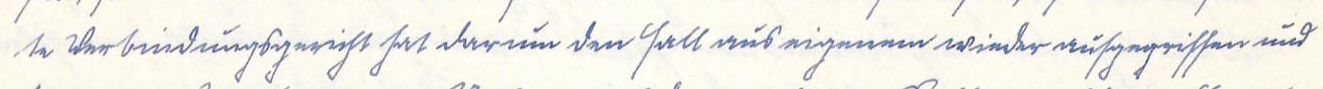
te Verbindungsgericht hat darum den Fall aus eigenem wieder aufgegriffen und
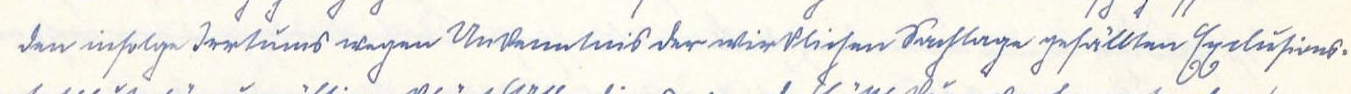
den infolge Irrtums wegen Unkenntnis der wirklichen Sachlage gefällten Exclusions-
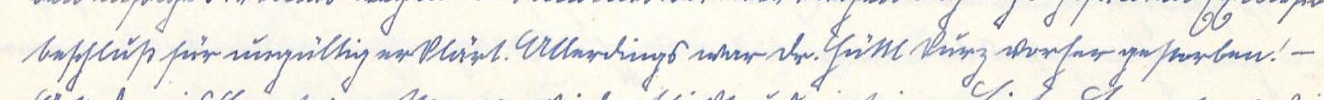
beschluß für ungültig erklärt. Allerdings war Dr. Hüttl kurz vorher gestorben!
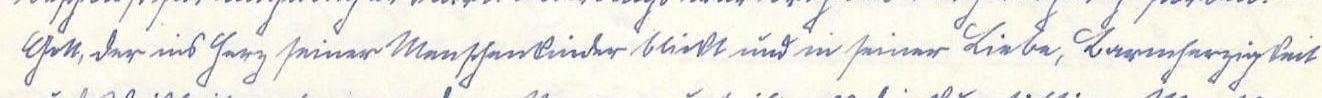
Gott, der ins Herz seiner Menschenkinder blickt und in seiner Liebe, Barmherzigkeit
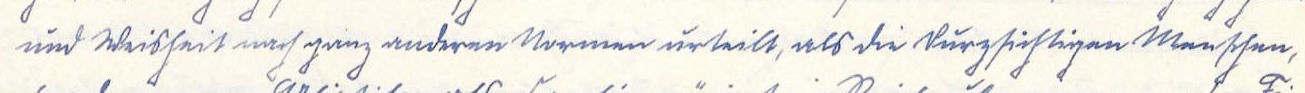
und Weisheit nach ganz anderen Normen urteilt, als die kurzsichtigen Menschen,
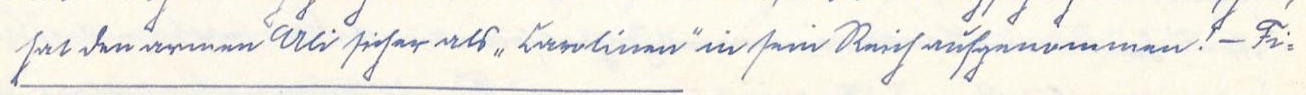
hat den armen Ali sicher als "Caroline“ in sein Reich aufgenommen. Fi-
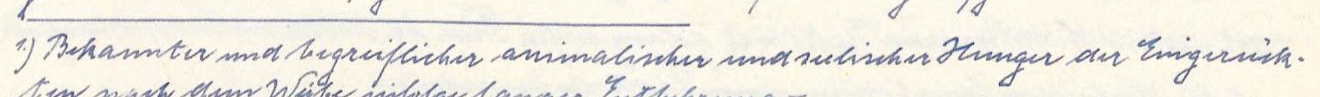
1.) Bekannter und begreiflicher animalischer und seelischer Hunger der Eingerück-
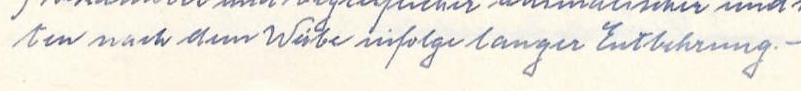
ten nach dem Weibe infolge langer Entbehrung.
